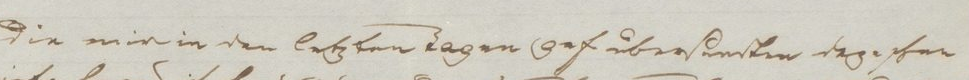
Die mir in den letzten Tagen gef übersandten Depeschen
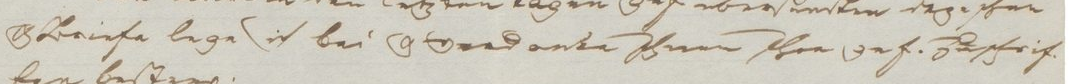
&Briefe lege ich bei & verdanke Ihnen Ihre gef. Zuschrif-
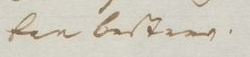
ten bestens.
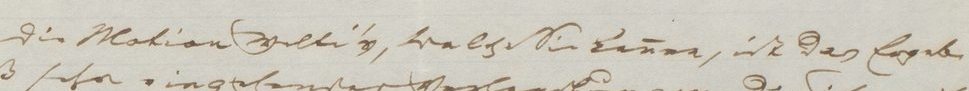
Die Motion Welti's, welche Sie kennen, ist das Ergeb-
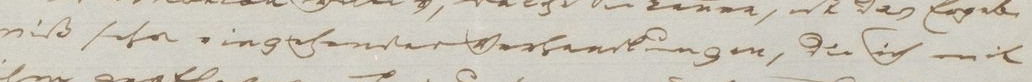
niß sehr eingehender Verhandlungen, die ich mit
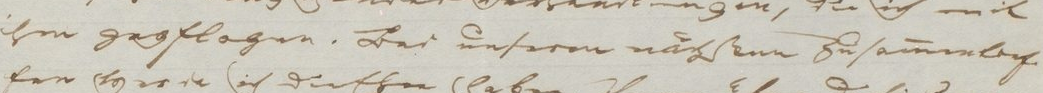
ihm gepflogen. Bei unserm nächsten Zusammentref-
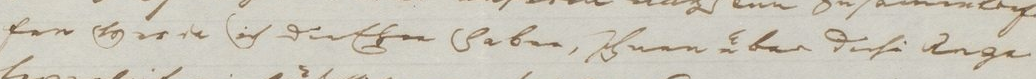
fen werde ich die Ehre haben, Ihnen über diese Ange-
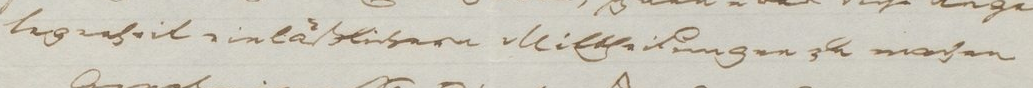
legenheit einläßlichere Mittheilungen zu machen.
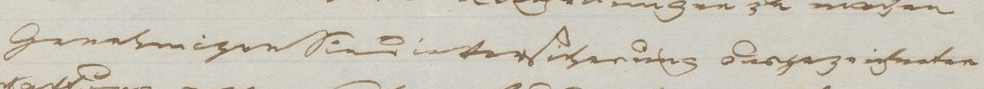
Genehmigen Sie die Versicherung ausgezeichneter
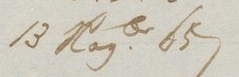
13 Novbr 65
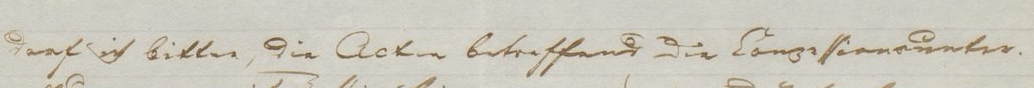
Darf ich bitten, die Acten betreffend die Conzessionsunter-
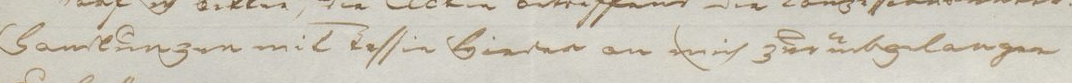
handlungen mit Tessin wieder an mich zurückgelangen
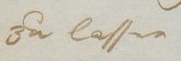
zu lassen.
